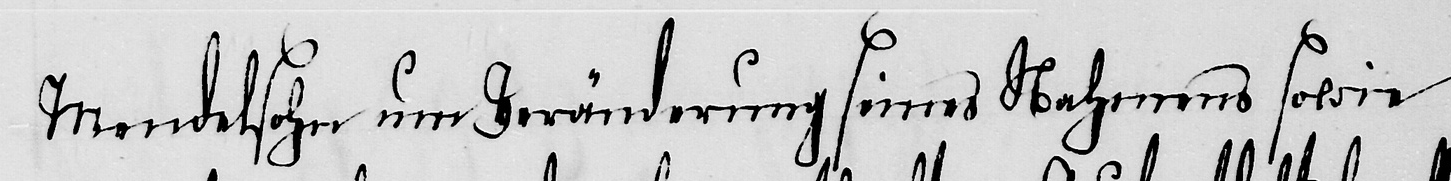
Mendelsohn um Veränderung seines Nahmens sowie
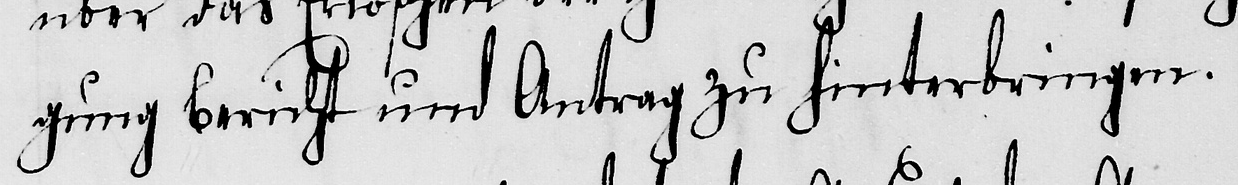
igung Bericht und Antrag zu hinterbringen.
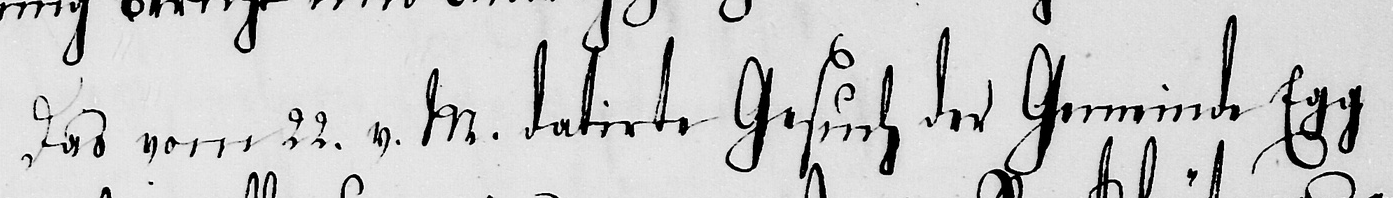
Das vom 22. v. M. datirte Gesuch der Gemeinde Egg
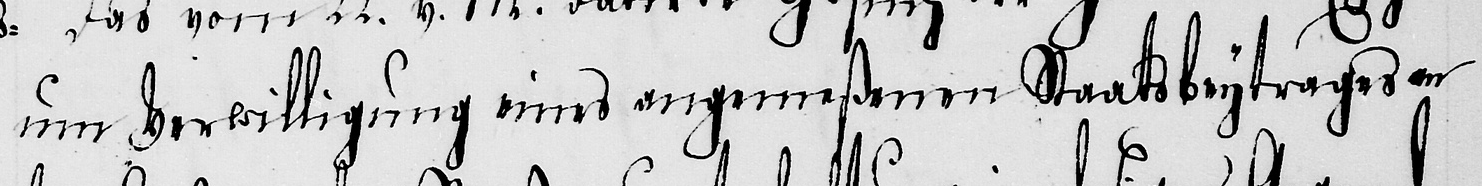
um Verwilligung eines angemeßenen Staatsbeytrages an
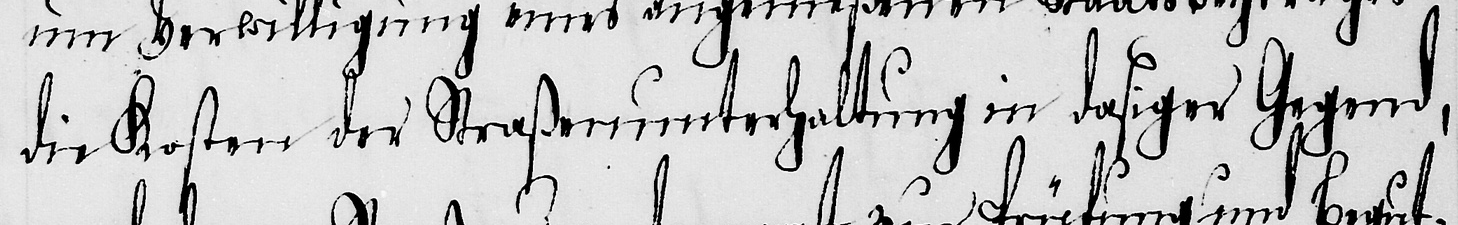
die Kosten der Straßenunterhaltung in dasiger Gegend,
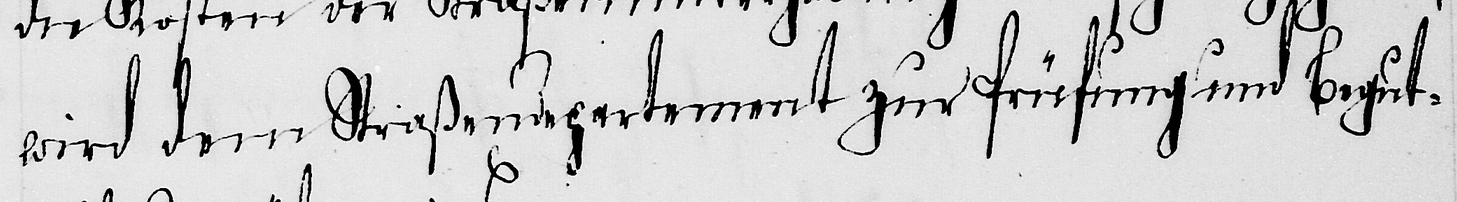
wird dem Straßendepartement zur Prüfung und Begut¬
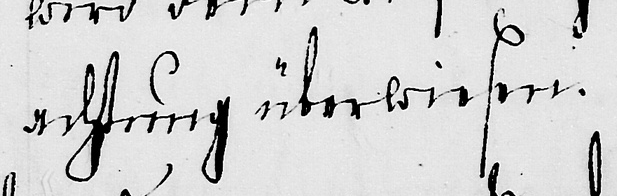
achtung überwiesen.
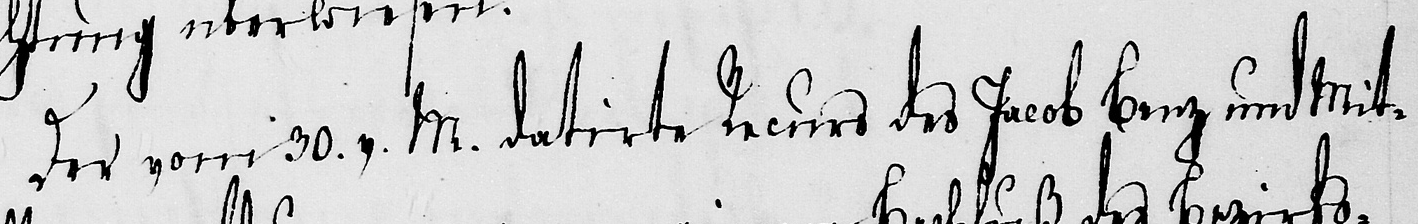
Der vom 30. v. M. datirte Recurs des Jacob Benz und Mit¬
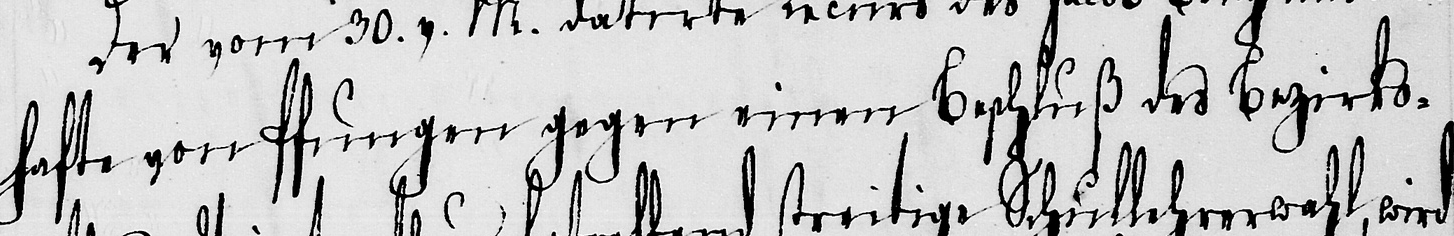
hafte von Pfungen gegen einen Beschluß des Bezirks¬
